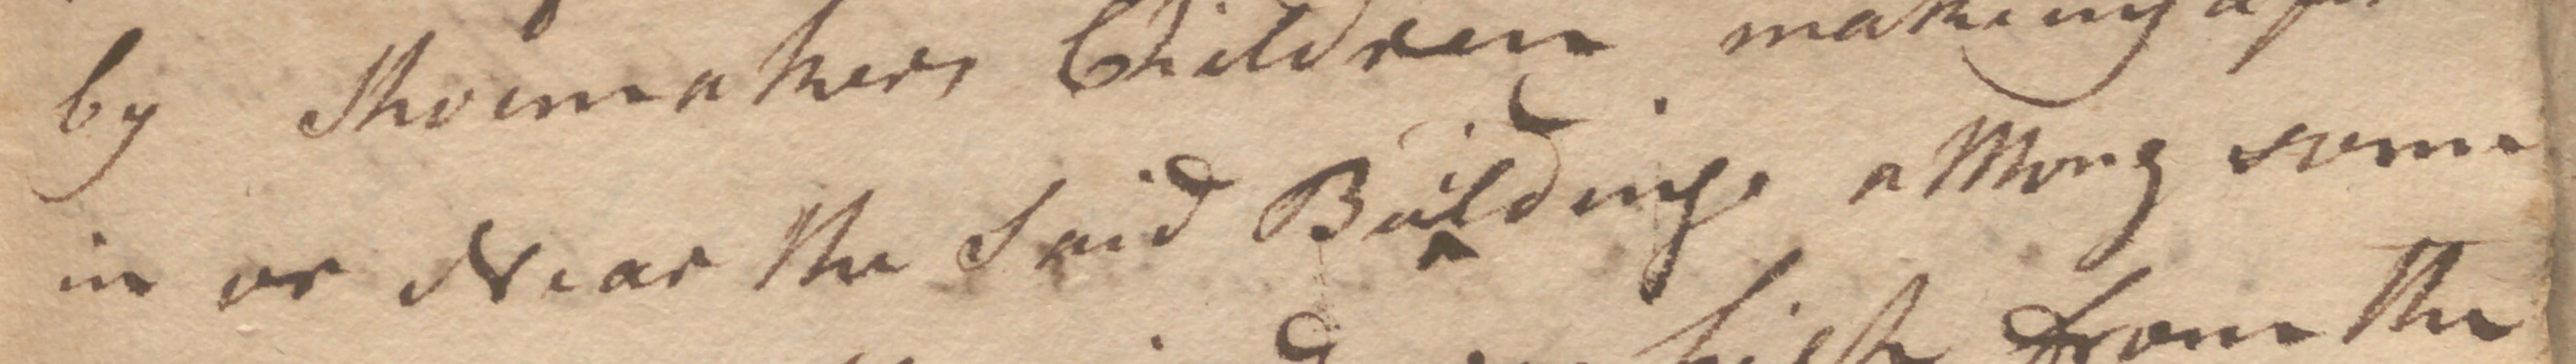in or Near the said Buildings a Mong some
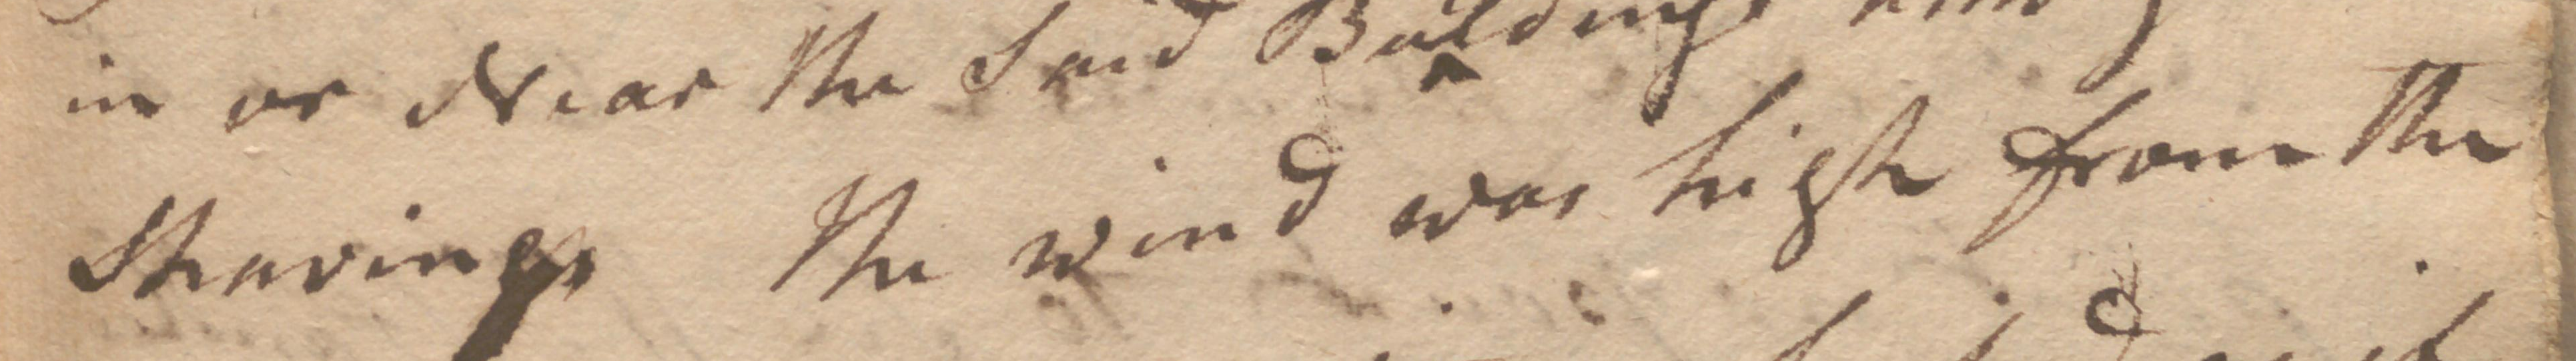Shavings the wind was high from the
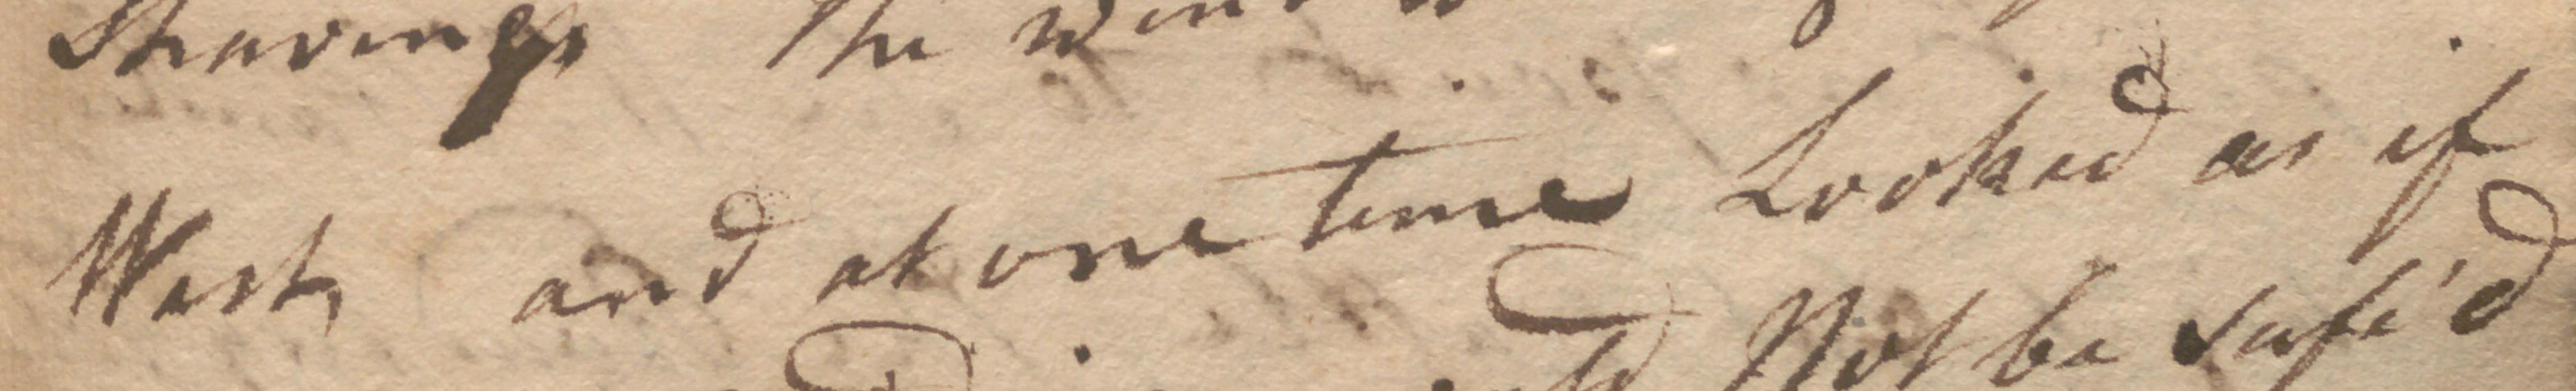West and at one time Looked as if
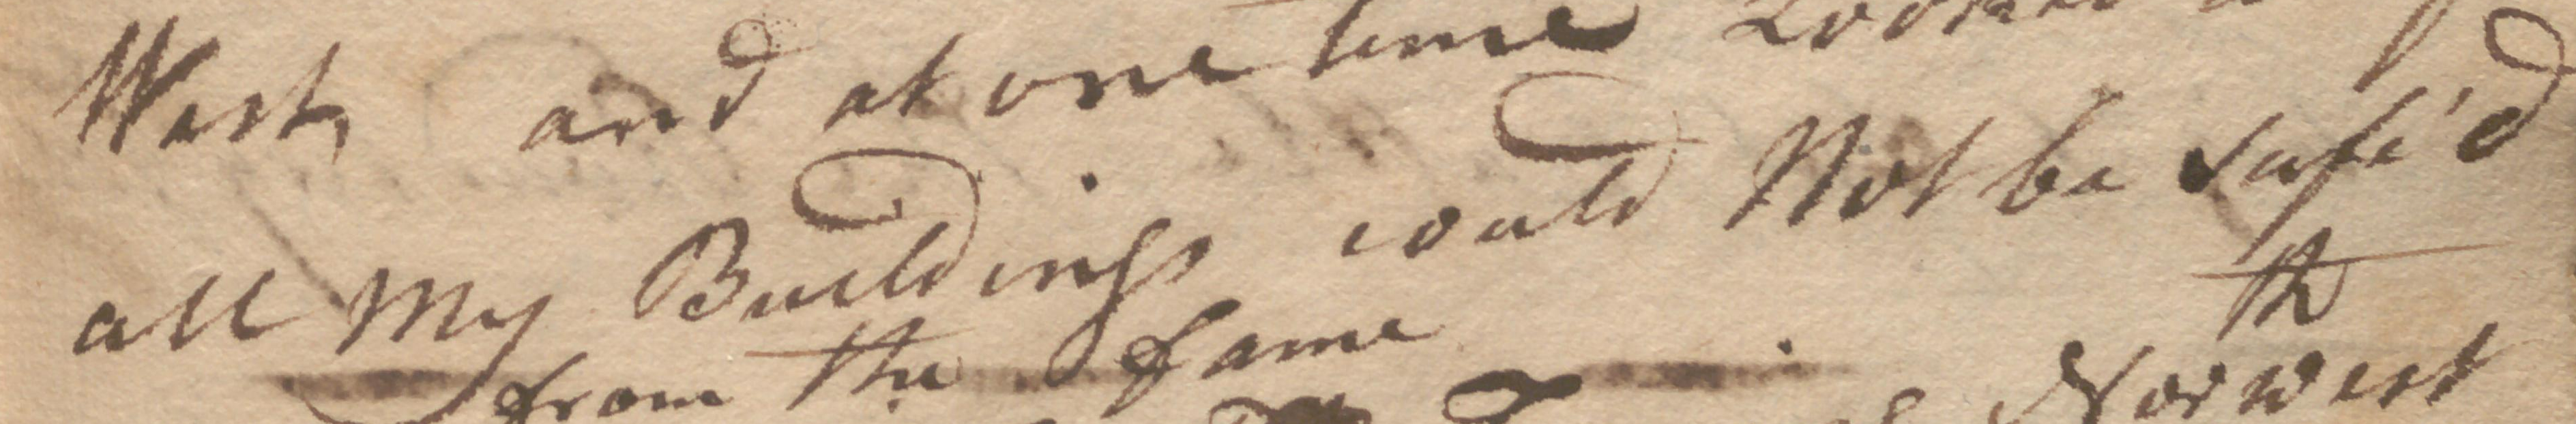all My Buildings could Not be safe'd
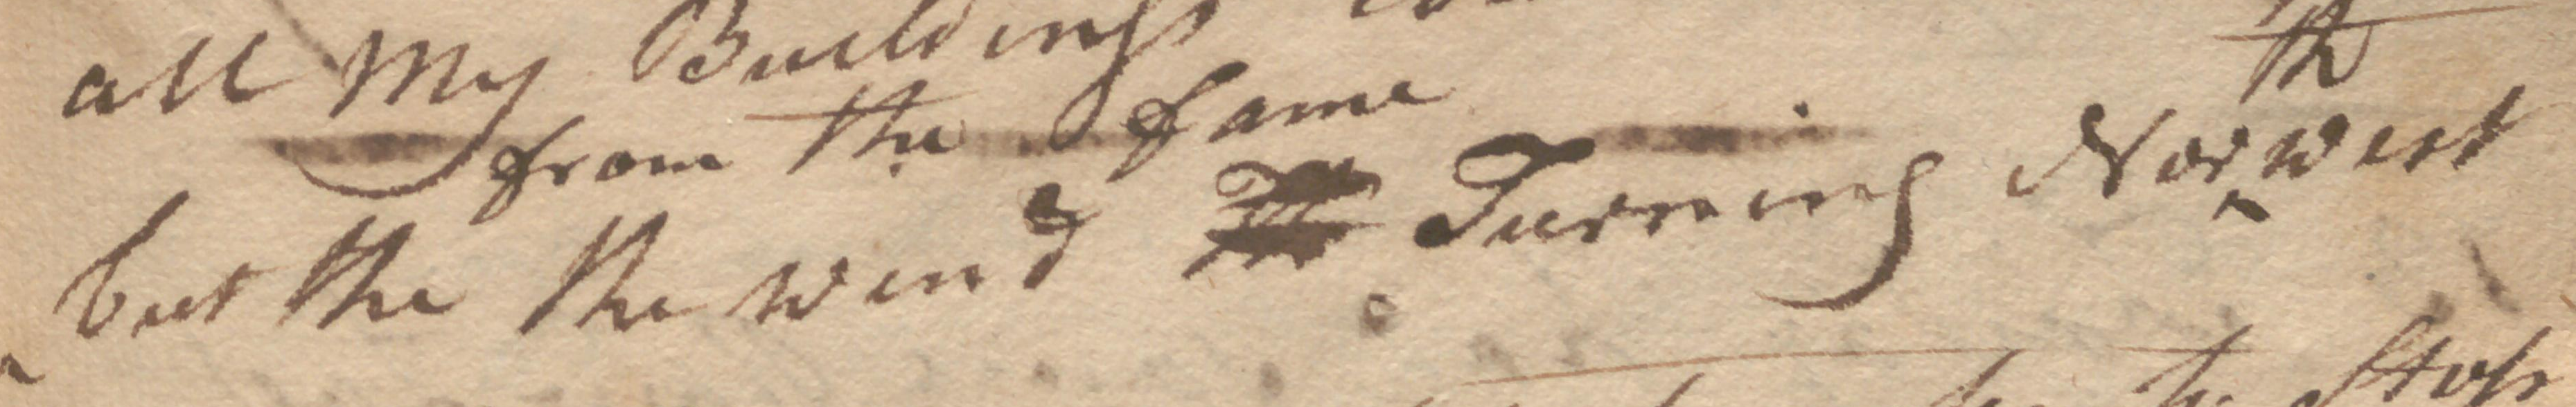but the the wind [__] Turning Nor^thwest
